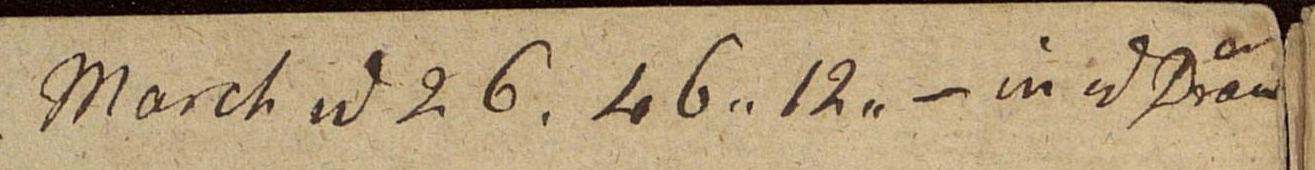March y^e 2 6. 46.. 12..- in y^e Draw^er
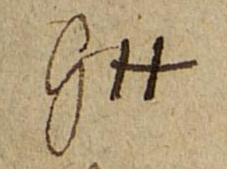GH
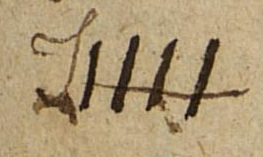T IIII
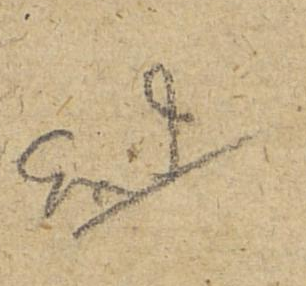EJ
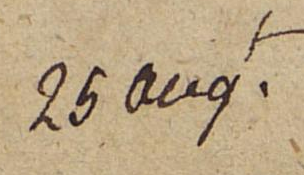25 Aug^t.
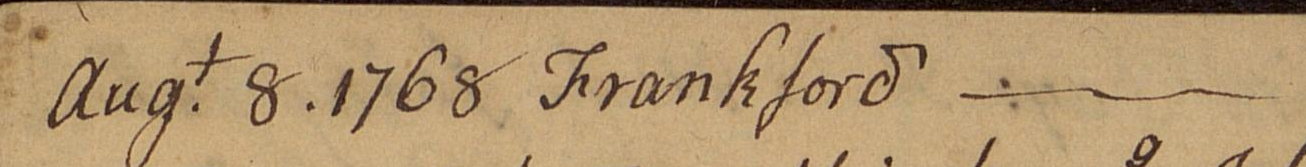Aug^t. 8. 1768 Frankford-
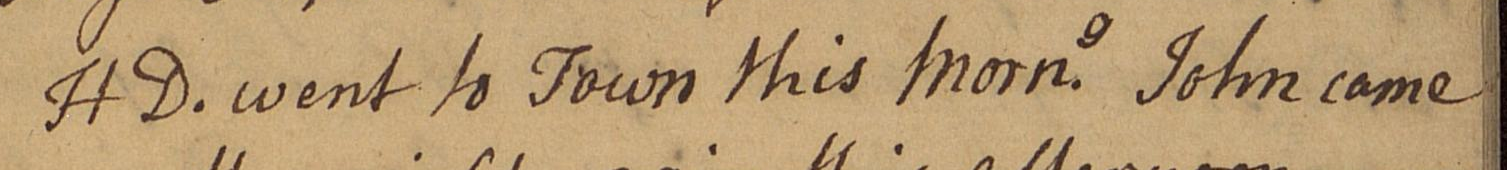H D. went to Town this Morn^g. John came
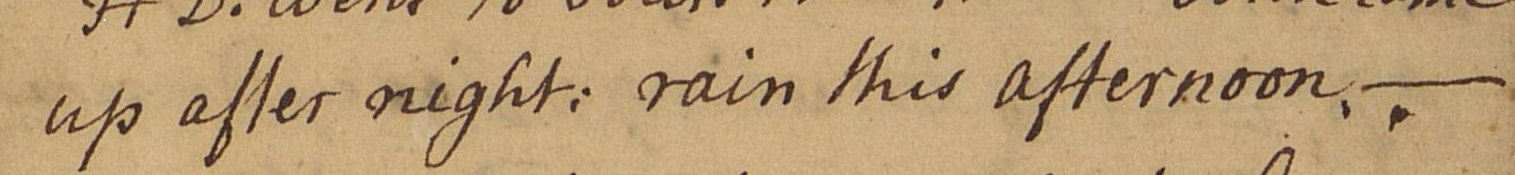up after night: rain this afternoon-
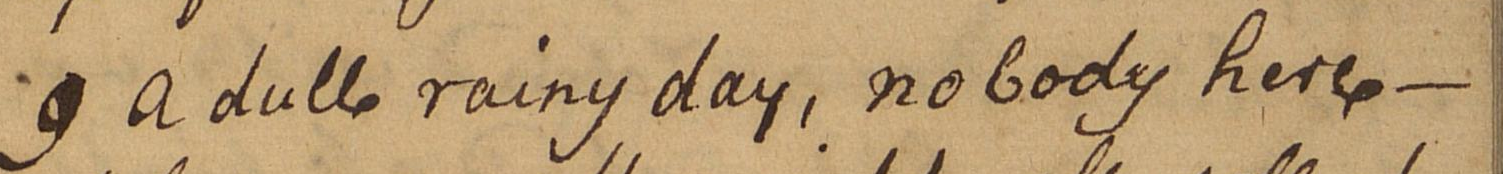9 A dull rainy day, no body here-
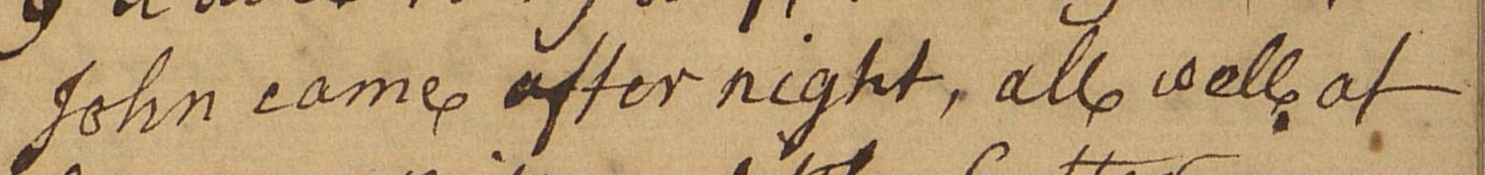John came after night, all well at
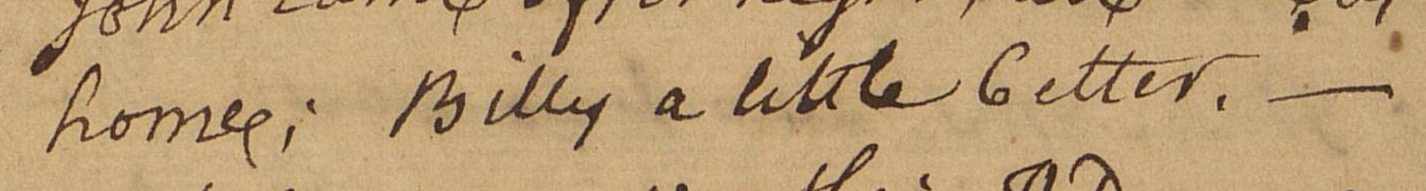home; Billy a little better.-
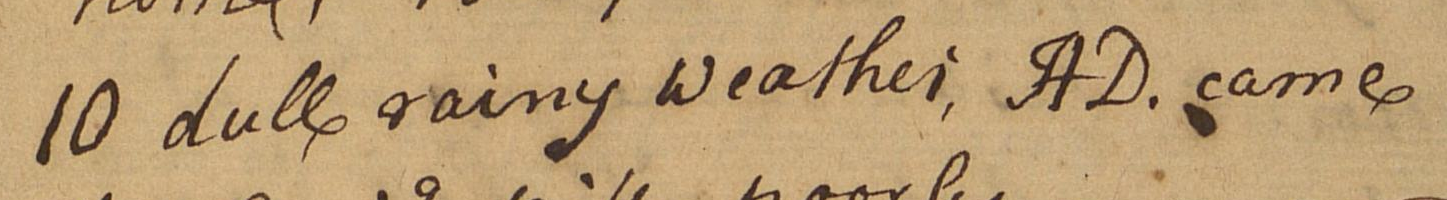10 dull rainy weather, HD. came
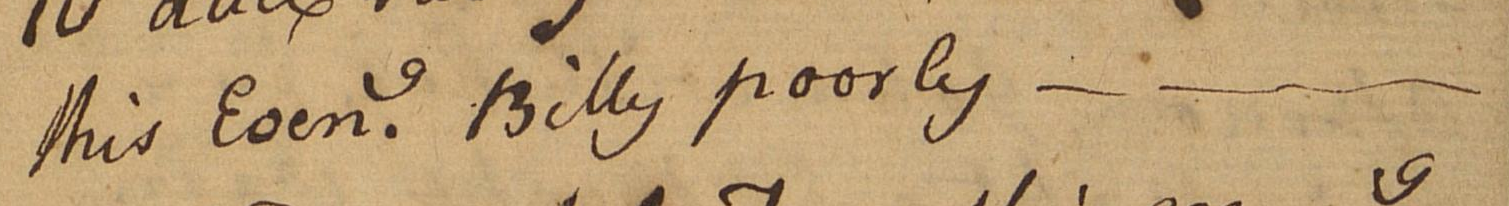this Even^g. Billy poorly-
